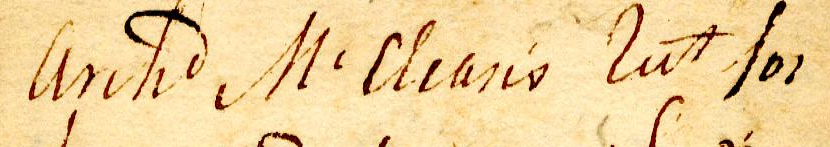Arch^d M^cClean's Rec^t for
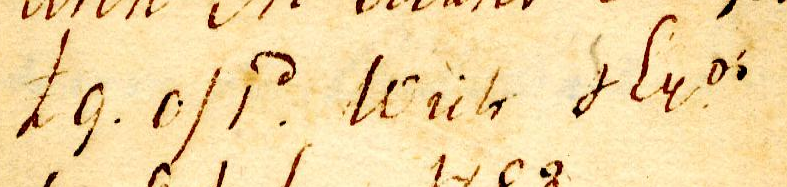£9. 0s 1^d Writs Ey^os
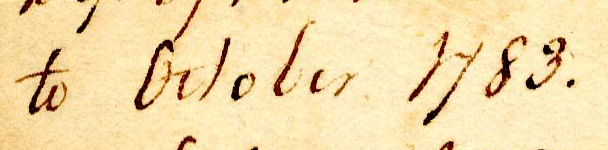to October 1783.
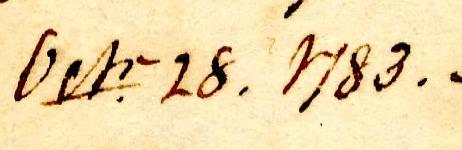Oct^r. 28. 1783.
